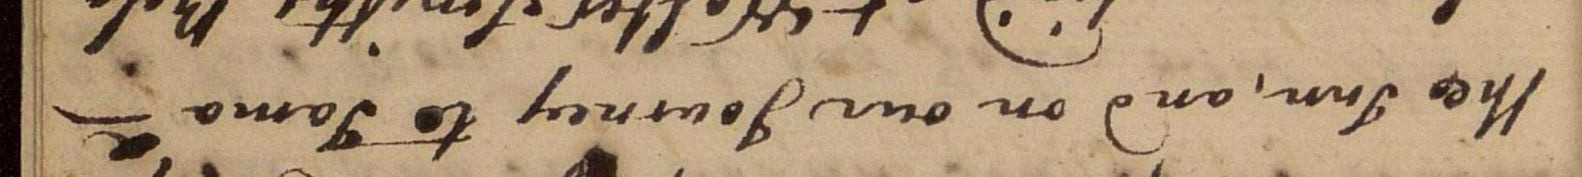the Inn, and on our Journey to Jama^a-
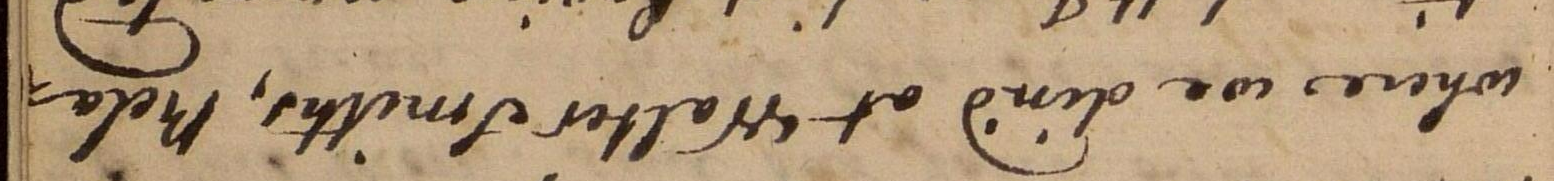where we din'd at Walter Smiths, Rela-
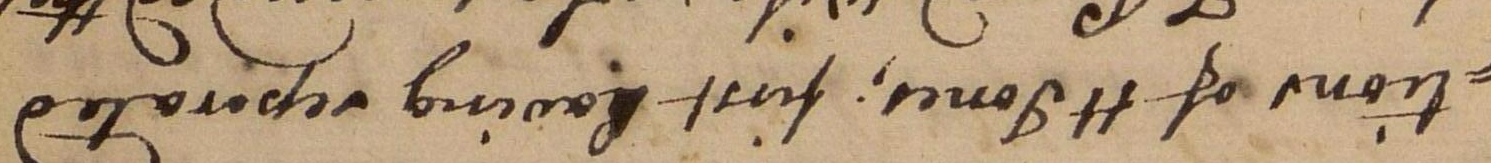-tions of H Jones; first [h]aving separated
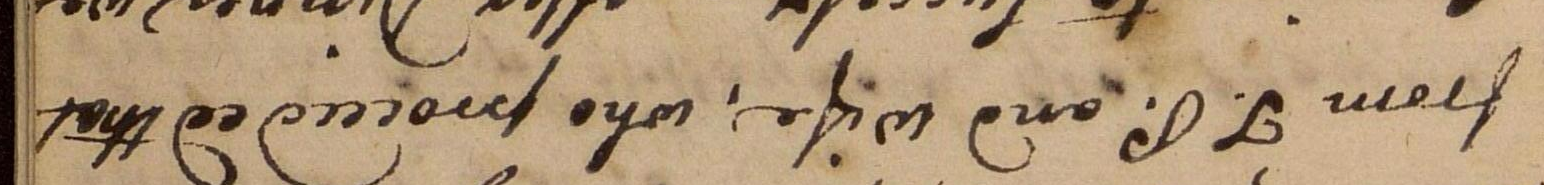from T. P. and Wife, who proceeded that
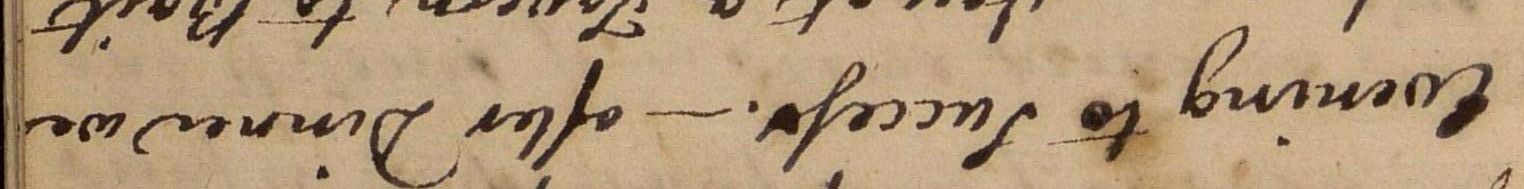Evening to Success.- after Dinner we
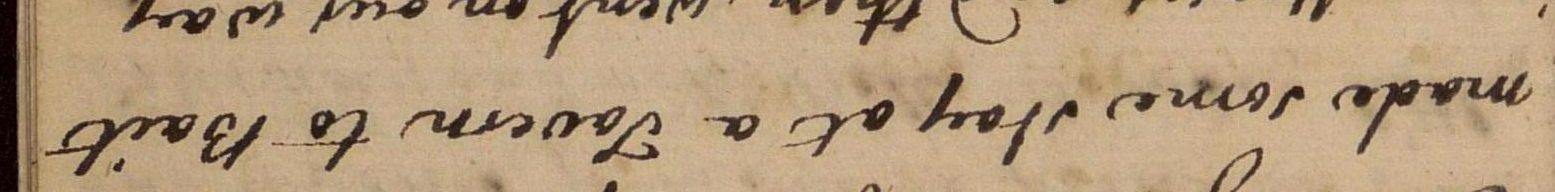made some stay at a Tavern to Bait
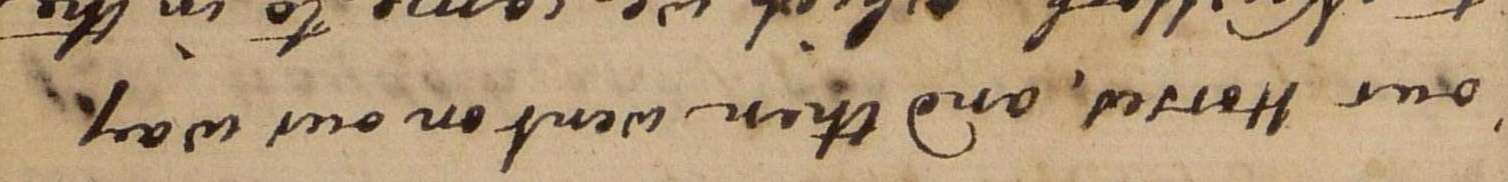our Horses, and then went on our way
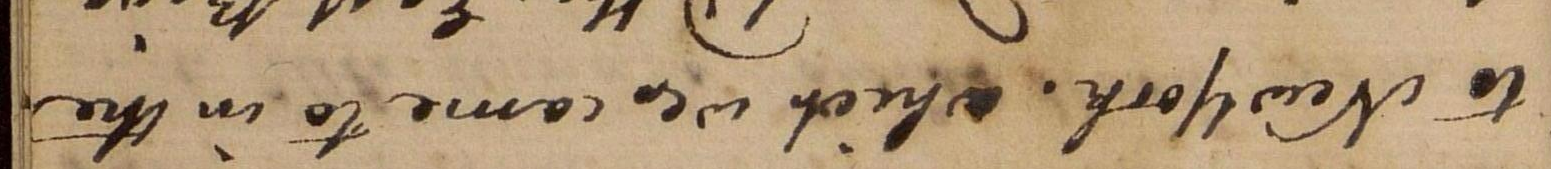to New York. which we came to in the
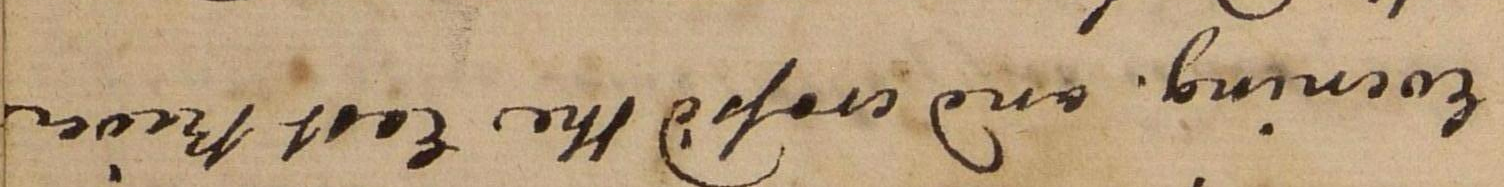Evening. and cross'd the East River
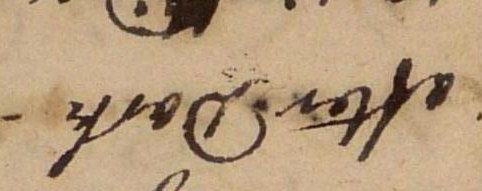after Dark-
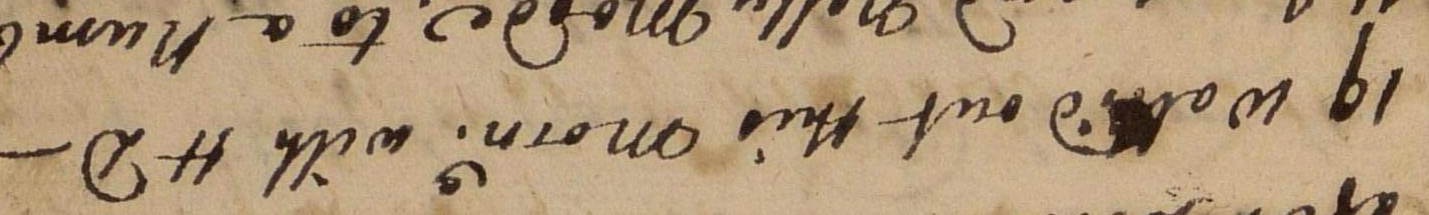19 Walk'd out this Morn^g. with HD -
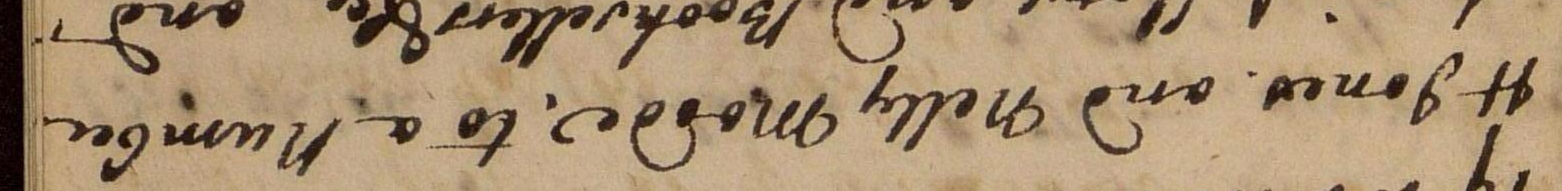H Jones. and Nelly Moode, to a Number
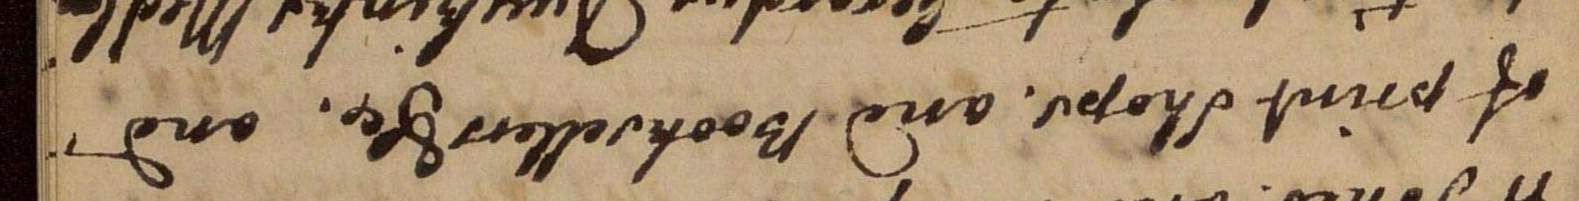of print Shops. and Booksellers &c. and
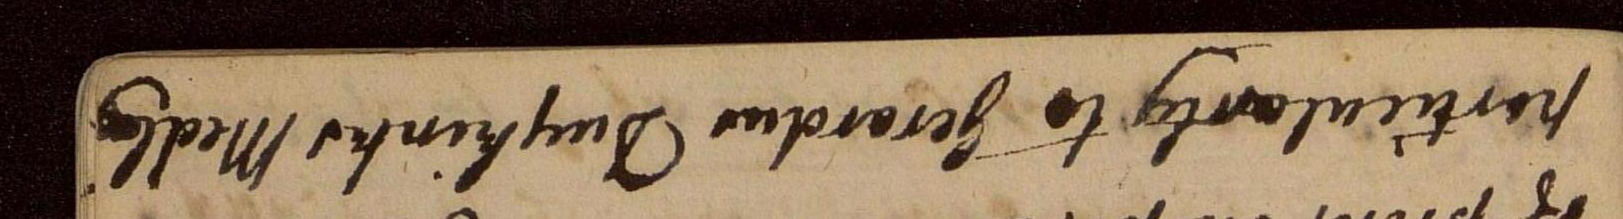particularly to Gerardus Duykinks Medley
